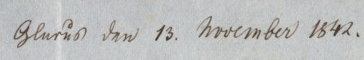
Glarus den 13. November 1842.
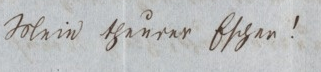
Mein theurer Escher!
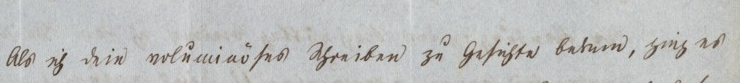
Als ich dein voluminöses Schreiben zu Gesichte bekam, ging es
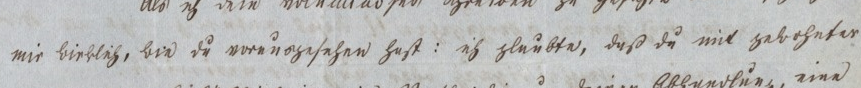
mir wirklich, wie du vorausgesehen hast: ich glaubte, daß du mit gewohnter
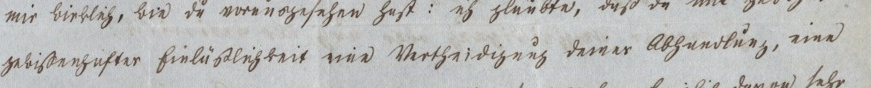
gewissenhafter Einläßlichkeit eine Vertheidigung deiner Abhandlung, eine
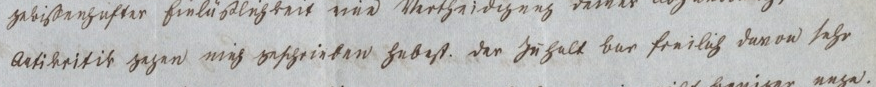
Antikritik gegen mich geschrieben habest. Der Inhalt war freilich davon sehr
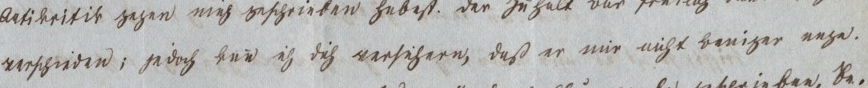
verschieden; jedoch kann ich dich versichern, daß er mir nicht weniger ange-
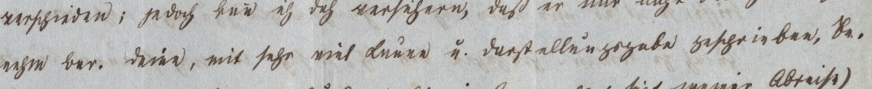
nehm war. Deine, mit sehr viel Laune u. Darstellungsgabe geschriebne, Be-
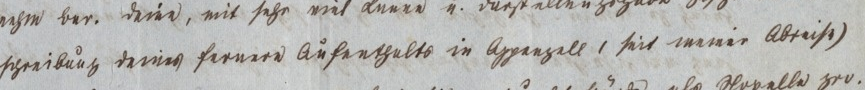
schreibung deines fernern Aufenthaltes in Appenzell (seit meiner Abreise)
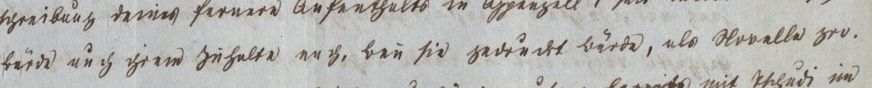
würde auch ihrem Inhalte nach, wenn sie gedruckt würde, als Novelle gro-
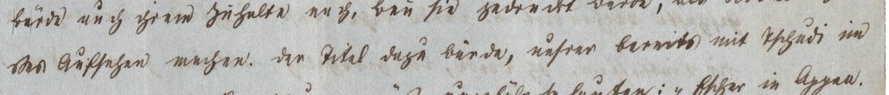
ßes Aufsehen machen. Der Titel dazu würde, unsrer bereits mit Tschudi im
